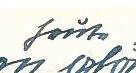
heute
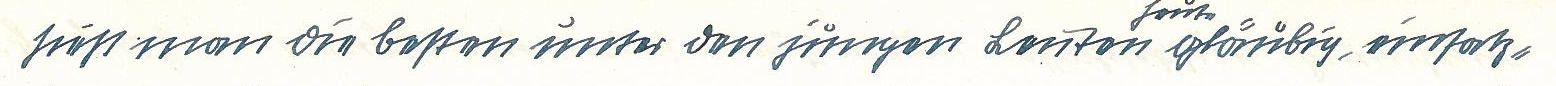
sieht man die besten unter den jüngeren Leuten gläubig, einsatz¬
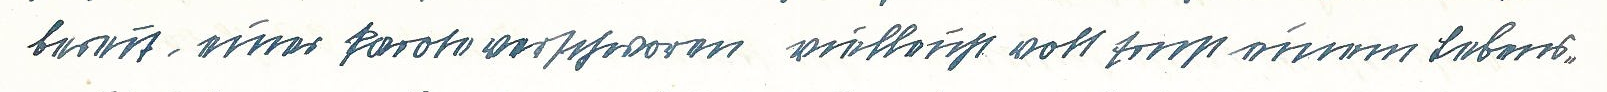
bereit, einer Parole verschworen vielleicht voll Ernst einem Lebens¬
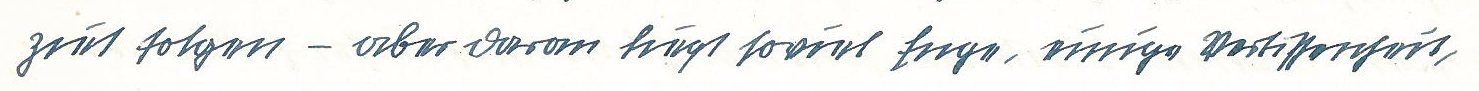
ziel folgen – aber daran liegt soviel Enge, einige Verbissenheit,
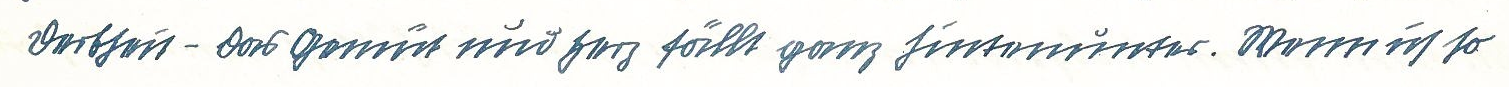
Derbheit – das Gemüt und Herz fällt ganz hintenunter. Wenn ich so
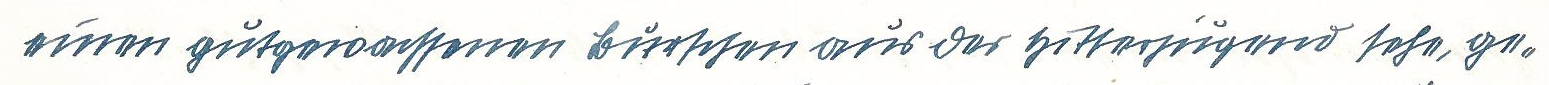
einen gutgewachsenen Burschen aus der Hitlerjugend sehe, ge¬
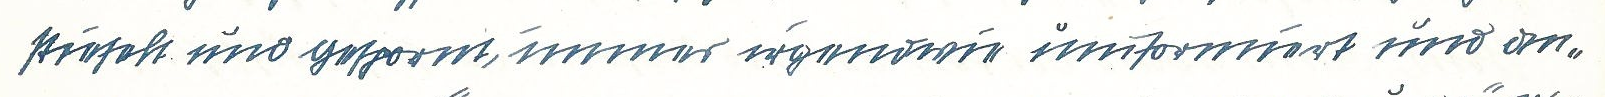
stiefelt und gespornt, immer irgendwie uniformiert und an¬
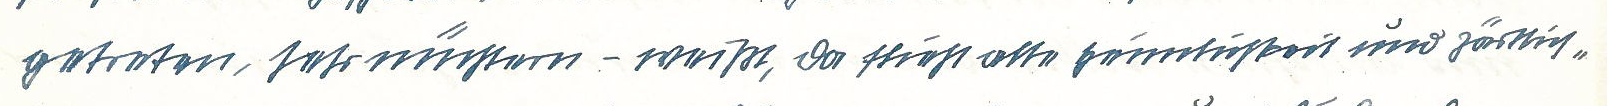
getreten, sehr nüchtern – weißt, da flieht alle Heimlichkeit und Zärtlich¬
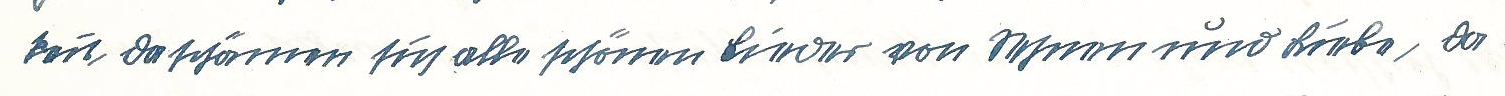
keit, da schämen sich alle schönen Lieder von Sehnen und Liebe, da
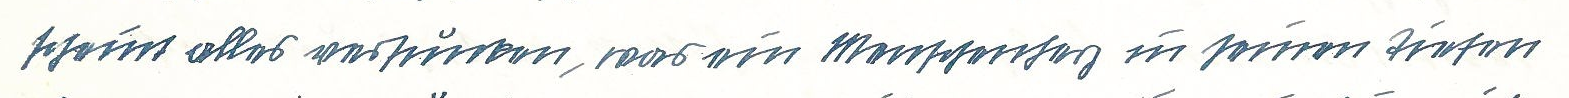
scheint alles versunken, was ein Menschenherz in seinen Tiefen
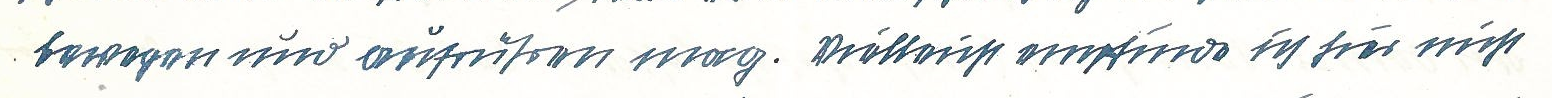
bewegen und aufrühren mag. Vielleicht empfinde ich hier nicht
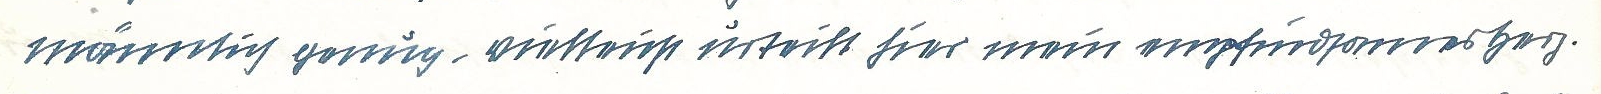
männlich genug, vielleicht urteilt hier mein empfindsames Herz.
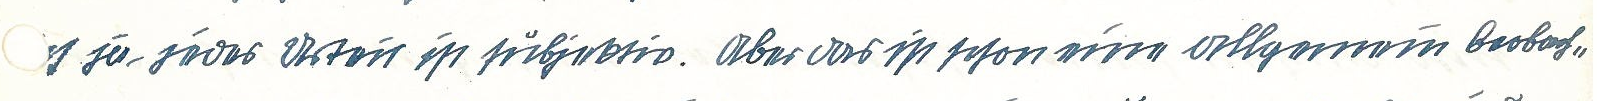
ch ja, jedes Urteil ist subjektiv. Aber das ist schon eine allgemein beobach¬
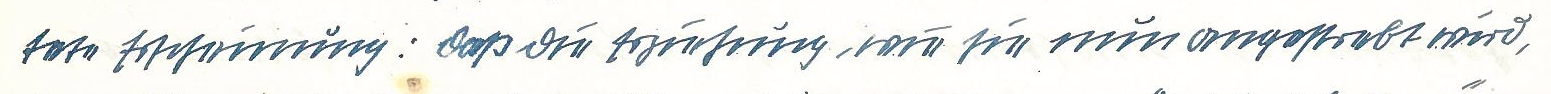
tete Erscheinung: daß die Erziehung, wie sie nun angestrebt wird,
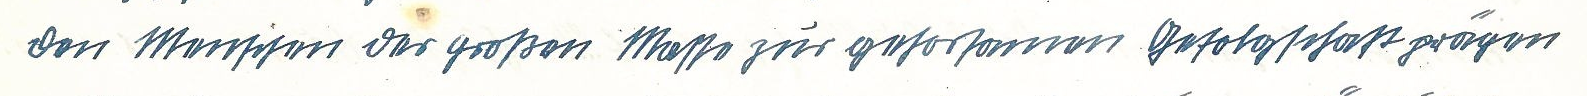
den Menschen der großen Masse zur gehorsamen Gefolgschaft prägen
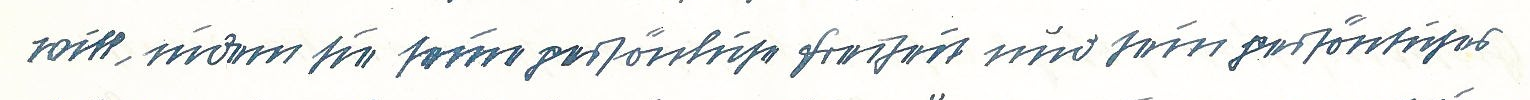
will, indem sie seine persönliche Freiheit und sein persönliches
